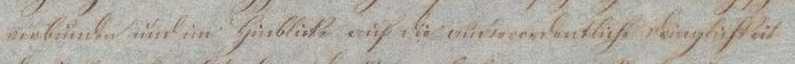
verbunden und im Hinblicke auf die außerordentliche Dringlichkeit
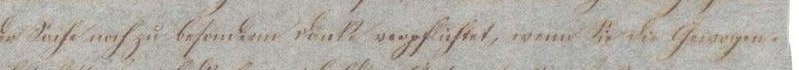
der Sache noch zu besonderm Danke verpflichtet, wenn Sie die Gewogen-
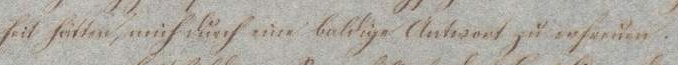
heit hätten, mich durch eine baldige Antwort zu erfreuen.
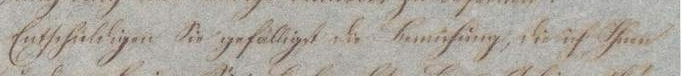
Entschuldigen Sie gefälligst die Bemühung, die ich Ihnen
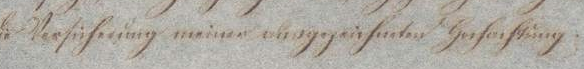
die Versicherung meiner ausgezeichneten Hochachtung.
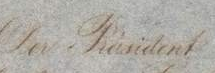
Der Präsident
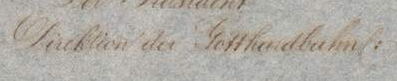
Direktion der Gotthardbahn:
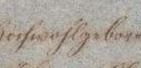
Hochwohlgeboren
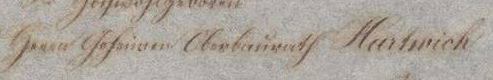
Herrn Geheimer Oberbaurath Hartwich
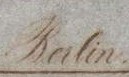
Berlin.
